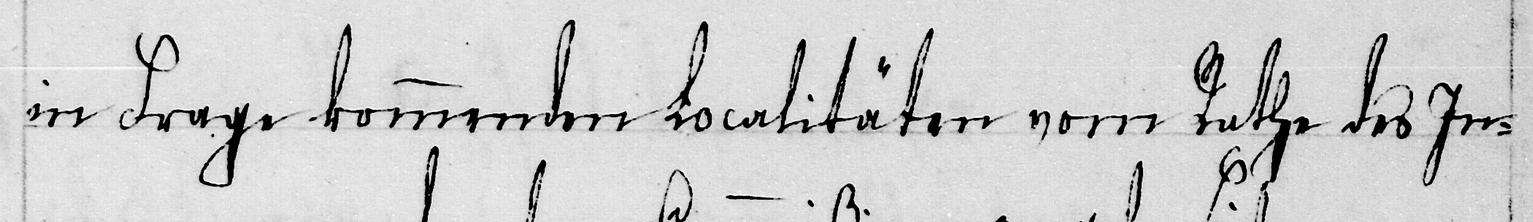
in Frage kommenden Localitäten vom Rathe des In¬
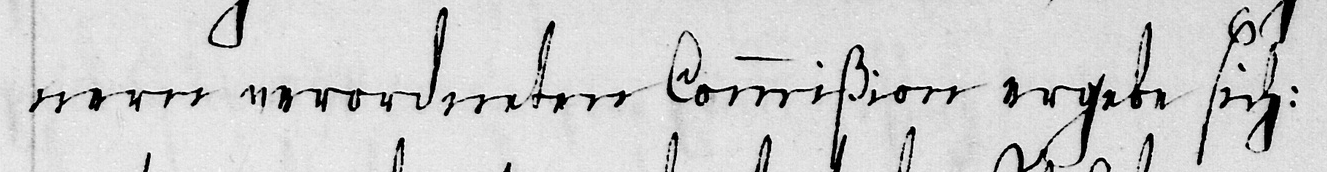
nern verordneten Commißion ergebe sich:
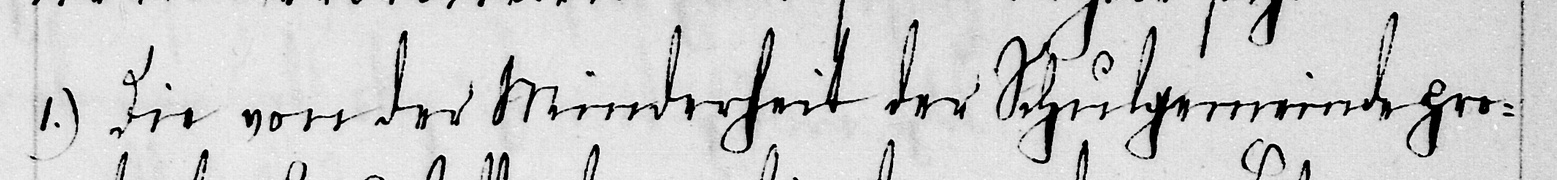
1.) Die von der Minderheit der Schulgemeinde pro¬
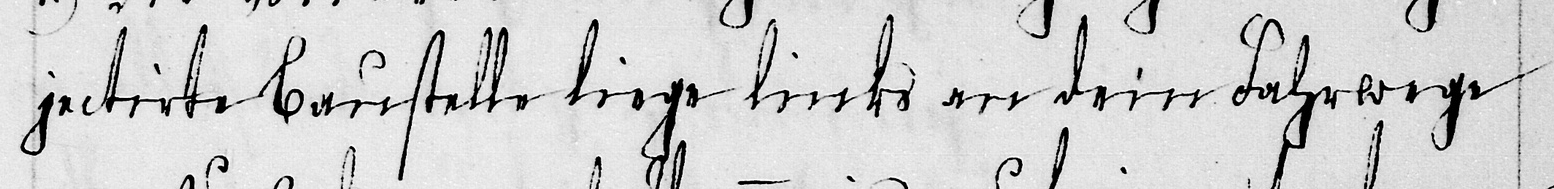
jectirte Baustelle liege links an dem Fahrwege
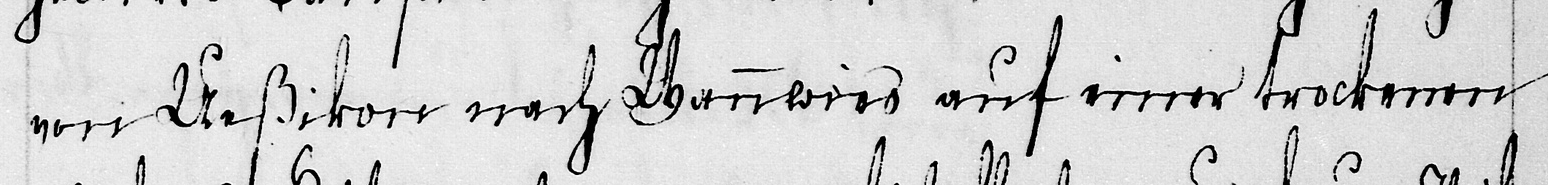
von Ueßikon nach Wannwies auf einer trockenen
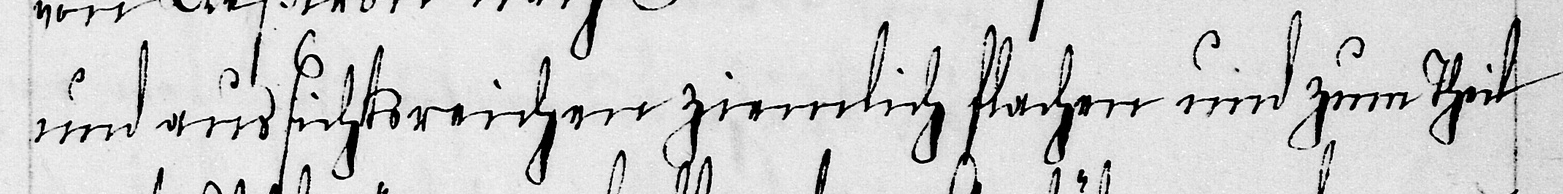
und aussichtsreichen ziemlich flachen und zum Theil
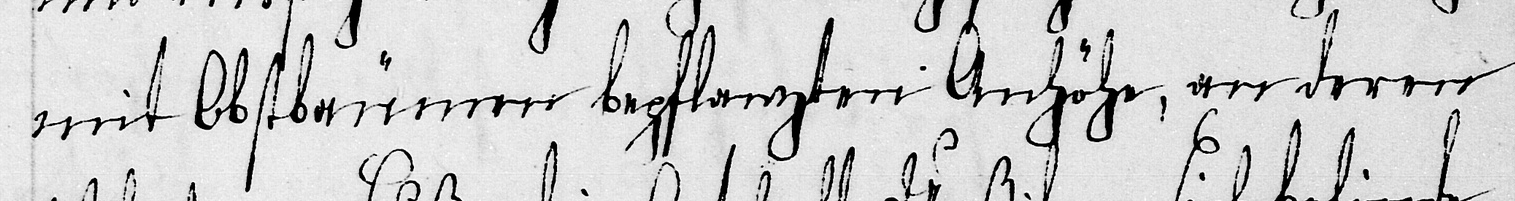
mit Obstbäumen bepflanzten Anhöhe, an deren
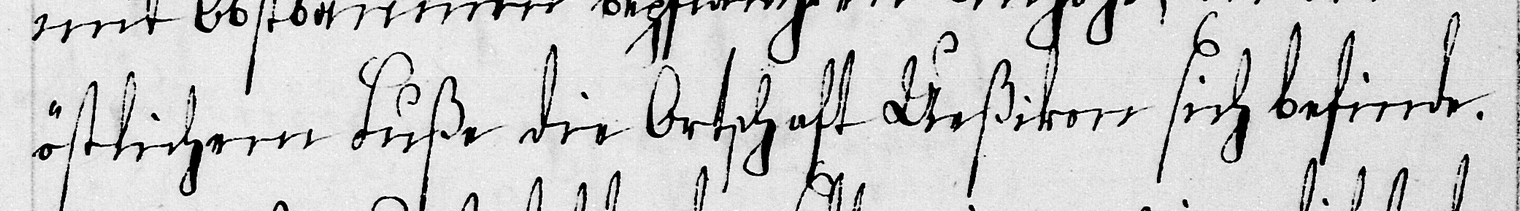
östlichem Fuße die Ortschaft Ueßikon sich befinde.
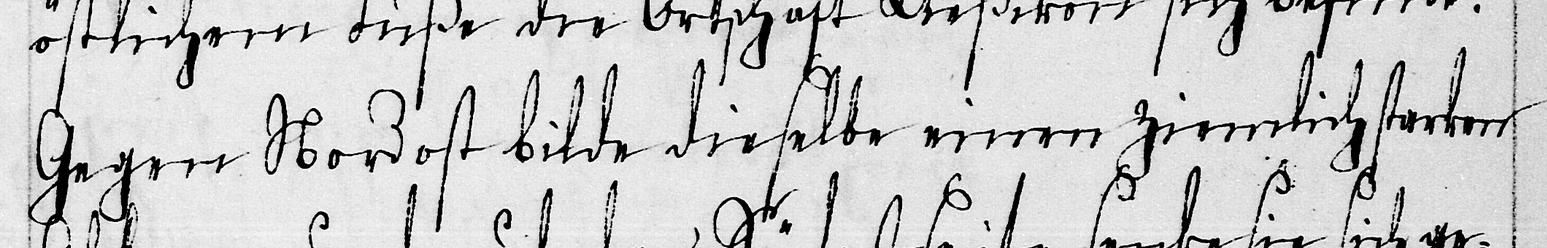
Gegen Nordost bilde dieselbe einen ziemlich starken
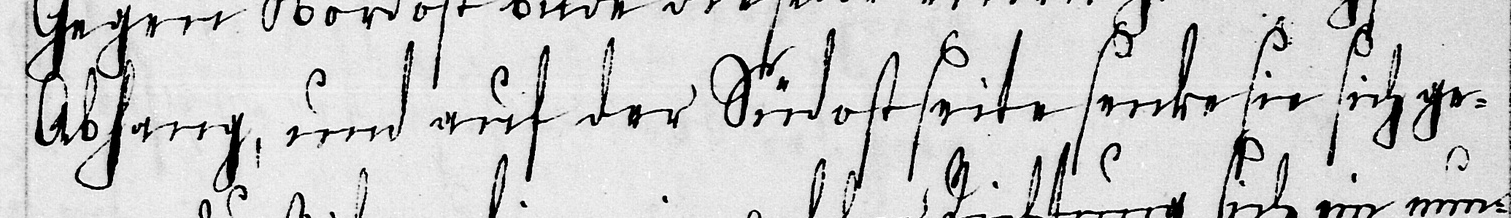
Abhang, und auf der Südostseite senke sie sich ge¬
